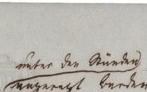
unter den Ständen
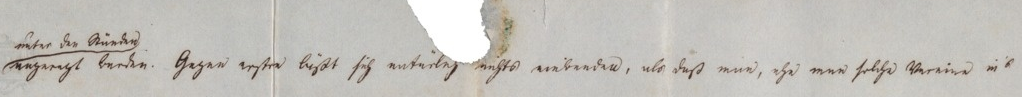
angeregt werden. Gegen erstre läßt sich natürlich nichts einwenden, als daß man, ehe man solche Vereine in's
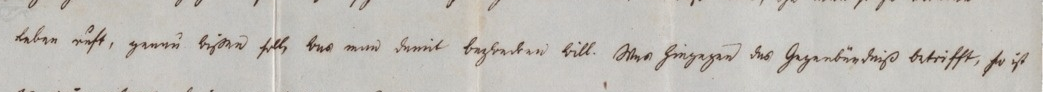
Leben ruft, genau wissen soll, was man damit bezwecken will. Was hingegen das Gegenbündniß betrifft, so ist
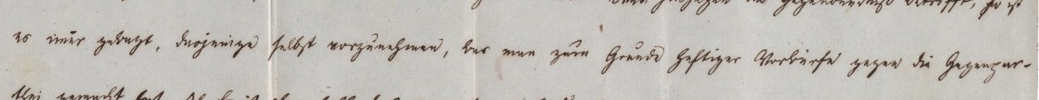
es immer gewagt, dasjenige selbst vorzunehmen, was man zum Grunde heftiger Vorwürfe gegen die Gegenpar-
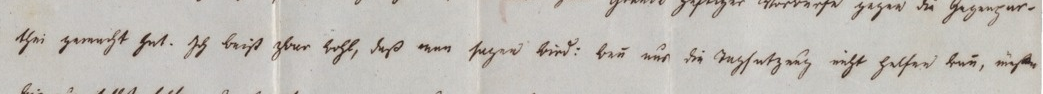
thei gemacht hat. Ich weiß zwar wohl, daß man sagen wird: Wenn uns die Tagsatzung nicht helfen kann, müßen
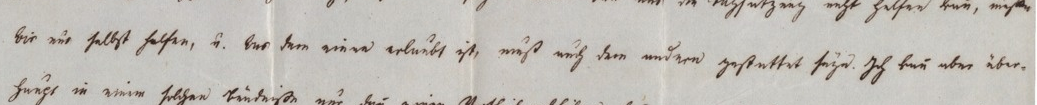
wir uns selbst helfen, u. was dem einen erlaubt ist, muß auch dem andern gestattet seyn. Ich kann aber über-
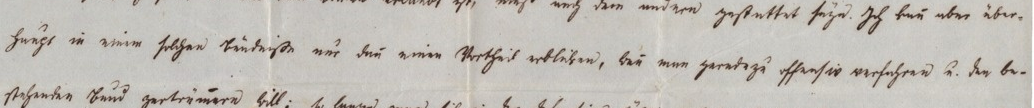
haupt in einem solchen Bündnisse nur dann einen Vortheil erblicken, wenn man geradezu offensiv verfahren u. den be-
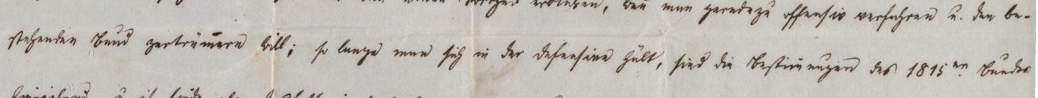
stehenden Gund zertrümmern will; so lange man sich in der Defensive hält, sind die Bestimmungen des 1815er Bundes
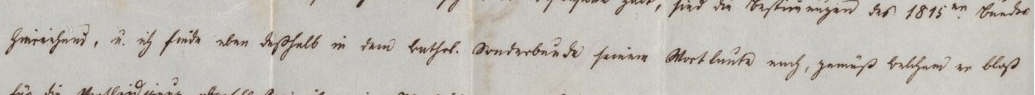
hinreichend, u. ich finde eben deßhalb in dem kathol. Sonderbunde seinem Wortlaute nach, gemäß welchem er bloß
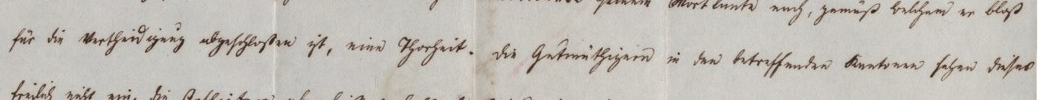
für die Vertheidigung abgeschlossen ist, eine Thorheit. Die Gutmüthigern in den betreffenden Kantonen sehen dieses
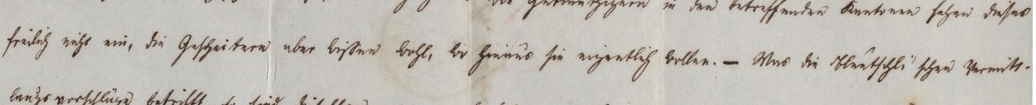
freilich nicht ein, die Gescheitern aber wissen wohl, wo hinaus sie eigentlich wollen. – Was die Bluntschli'schen Vermitt-
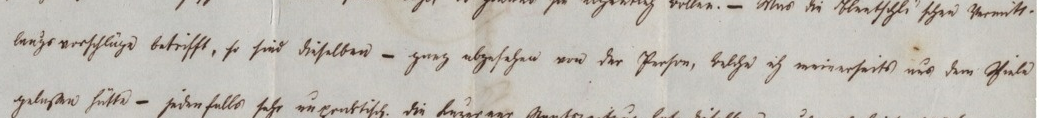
lungsvorschläge betrifft, so sind dieselben – ganz abgesehen von der Person, welche ich meinerseits aus dem Spiele
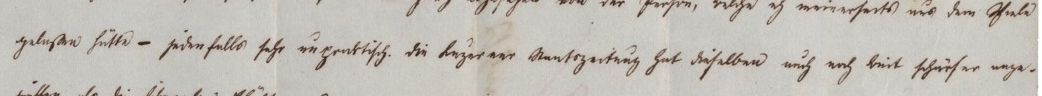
gelaßen hätte – jedenfalls sehr unpraktisch. Die Luzerner Staatszeitung hat dieselben auch noch weit schärfer ange-
